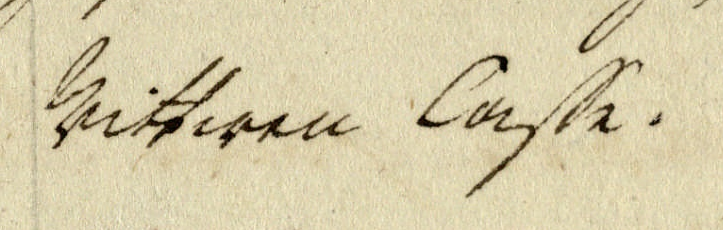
Wittwen Casse.
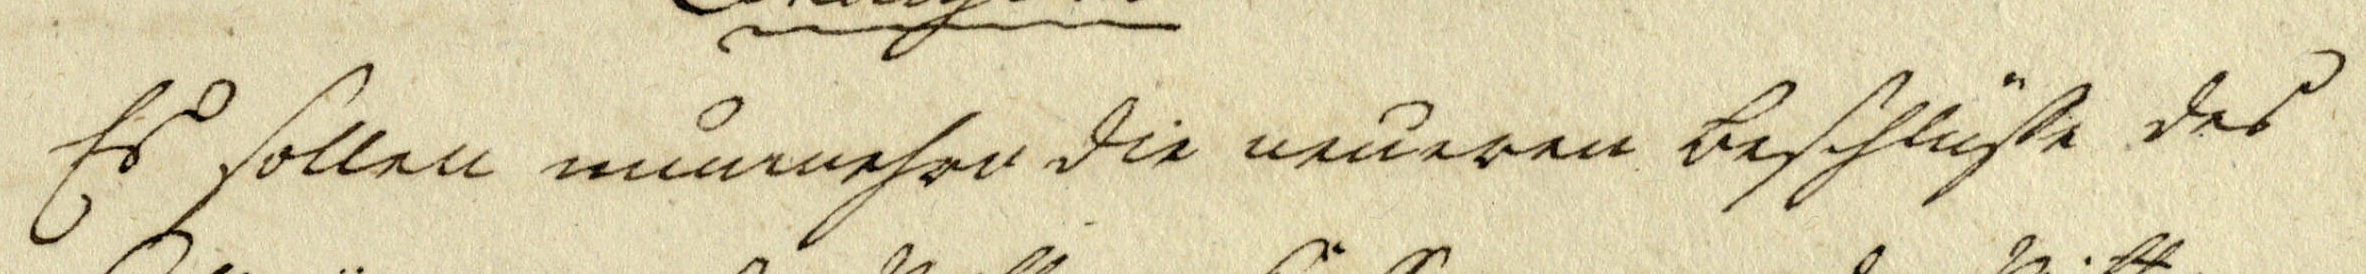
Es sollen nunmehro die neueren Beschlüsse des
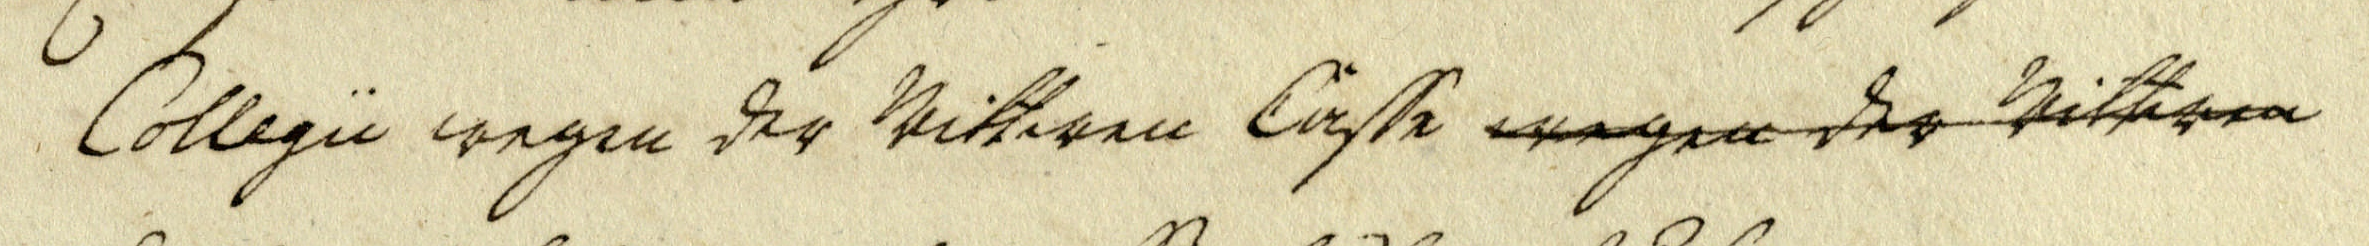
Collegii wegen der Wittwen Casse wegen der Wittwen
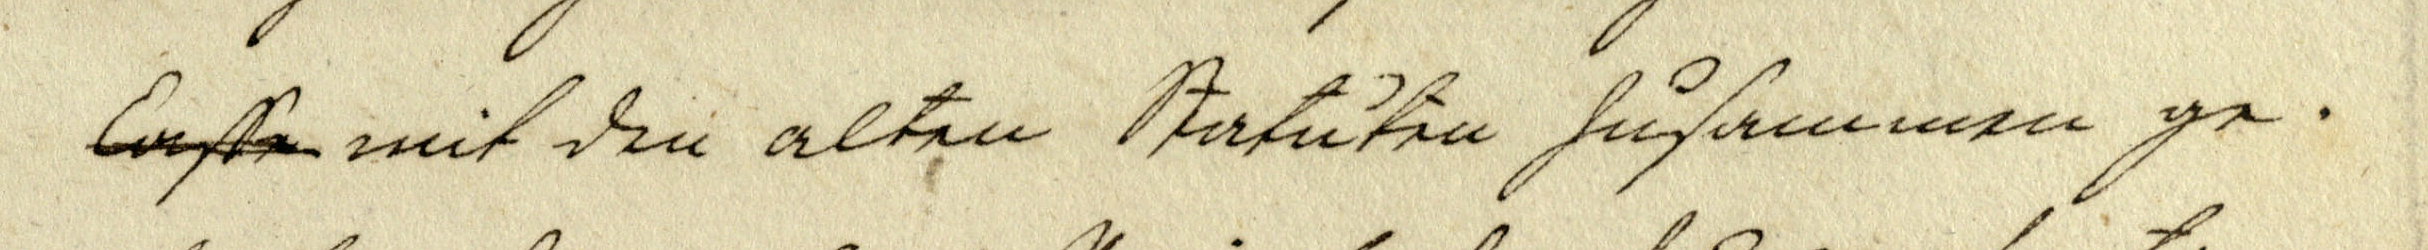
Casse mit den alten Statuten zusammen ge¬
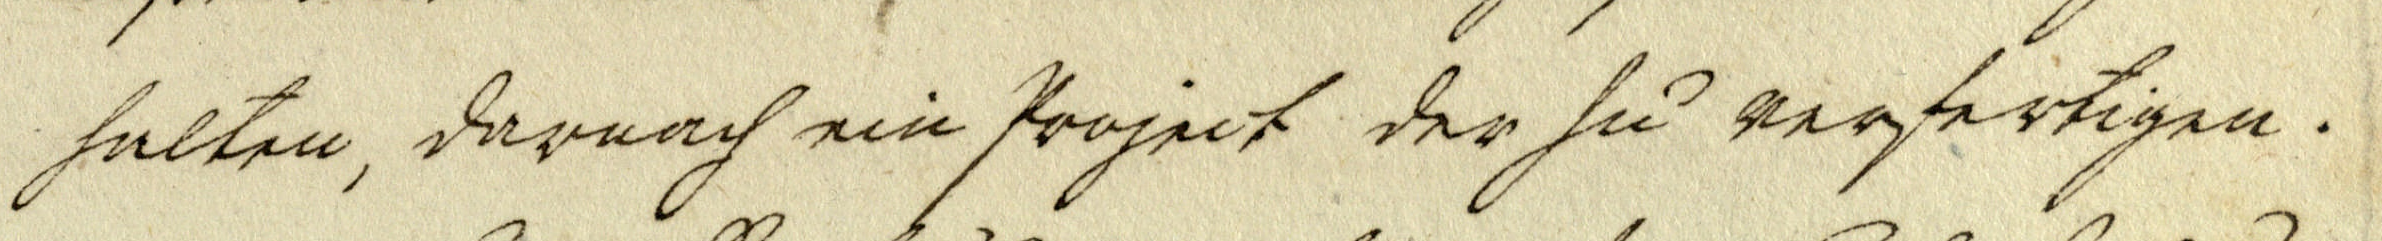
halten, darnach ein Project der zu verfertigen¬
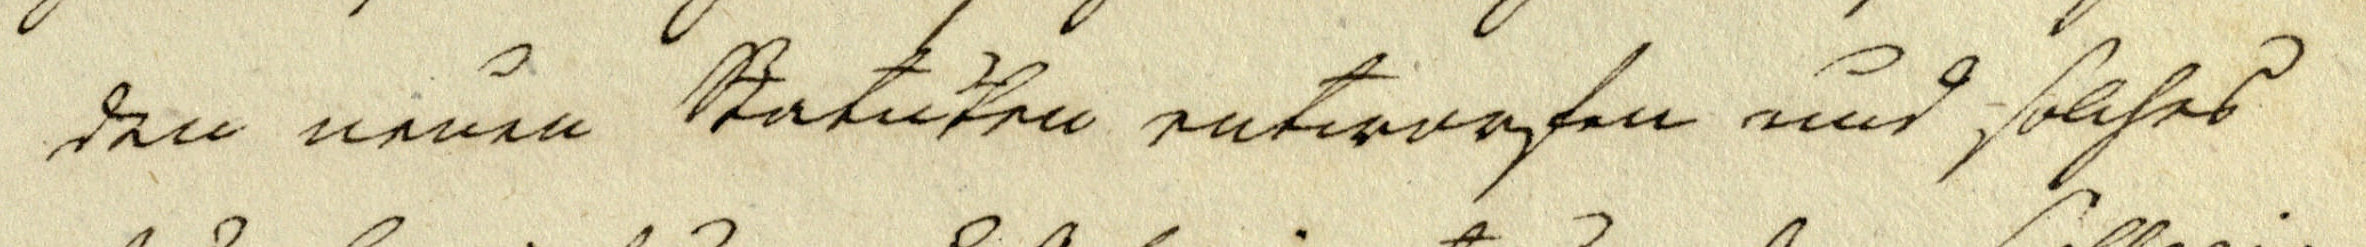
den neuen Statuten entworfen und solches
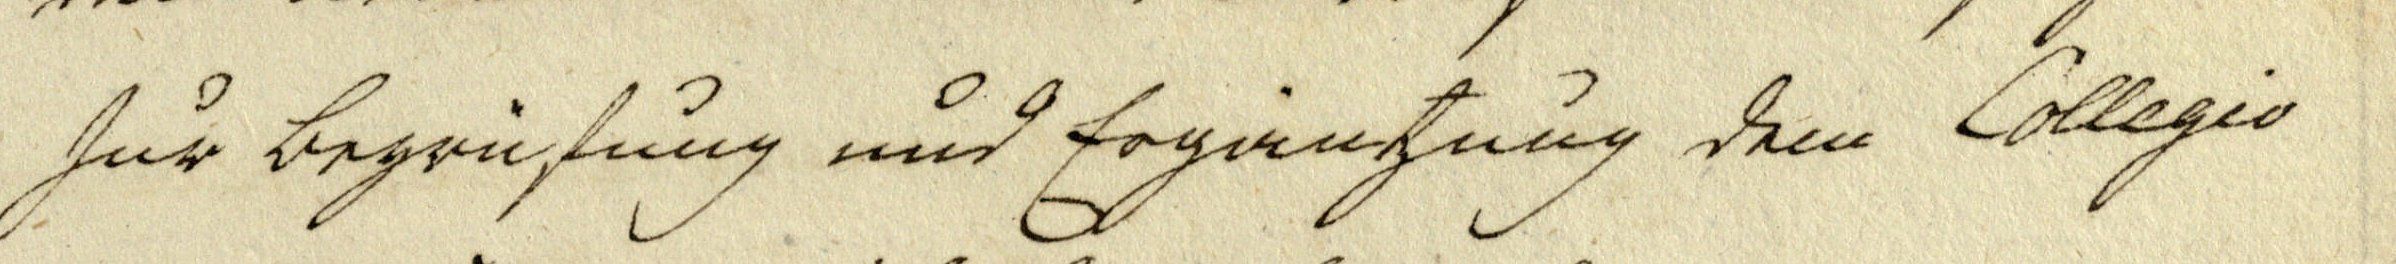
zur Beprüfung und Ergäntzung dem Collegio
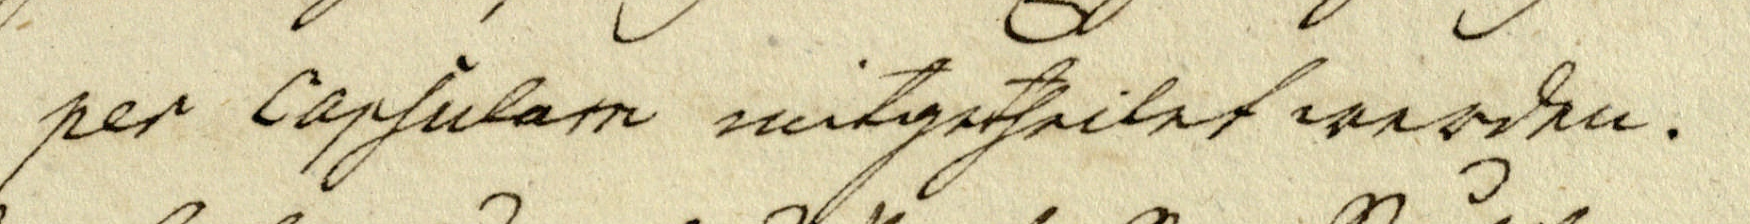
per Capsulam mitgetheilet werden.
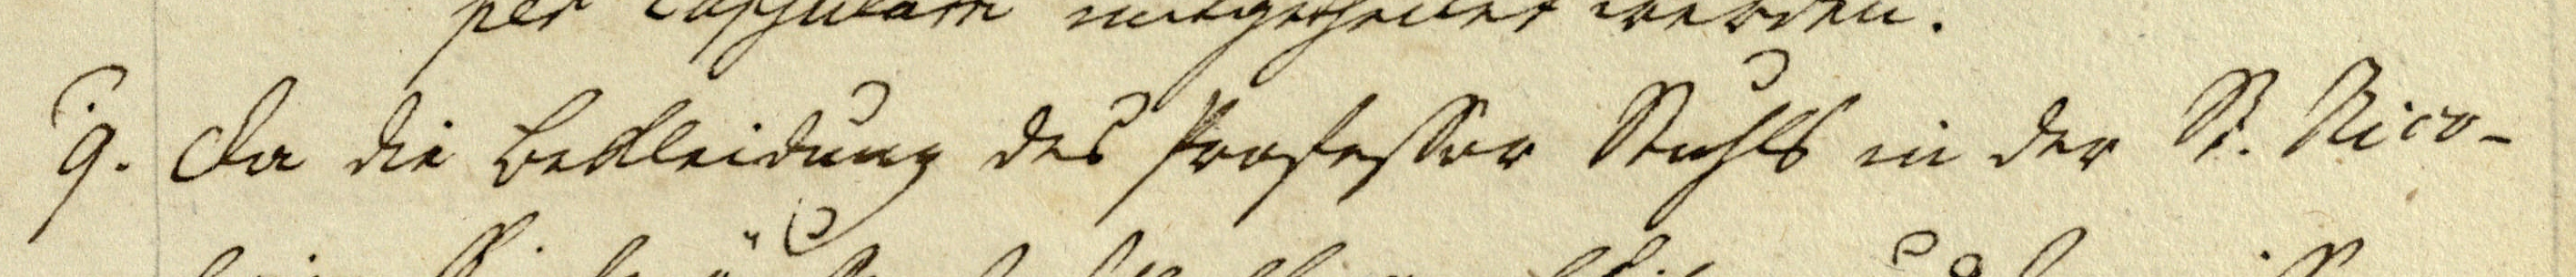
9. Da die Bekleidung des Professor Stuhls in der St. Nico¬
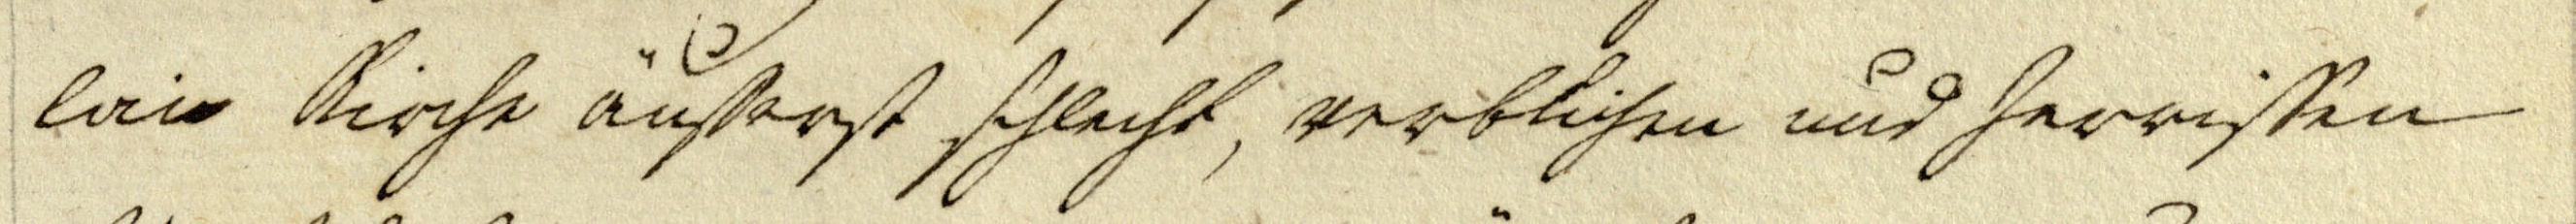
lai Kirche äusserst schlecht, verblichen und zerrissen
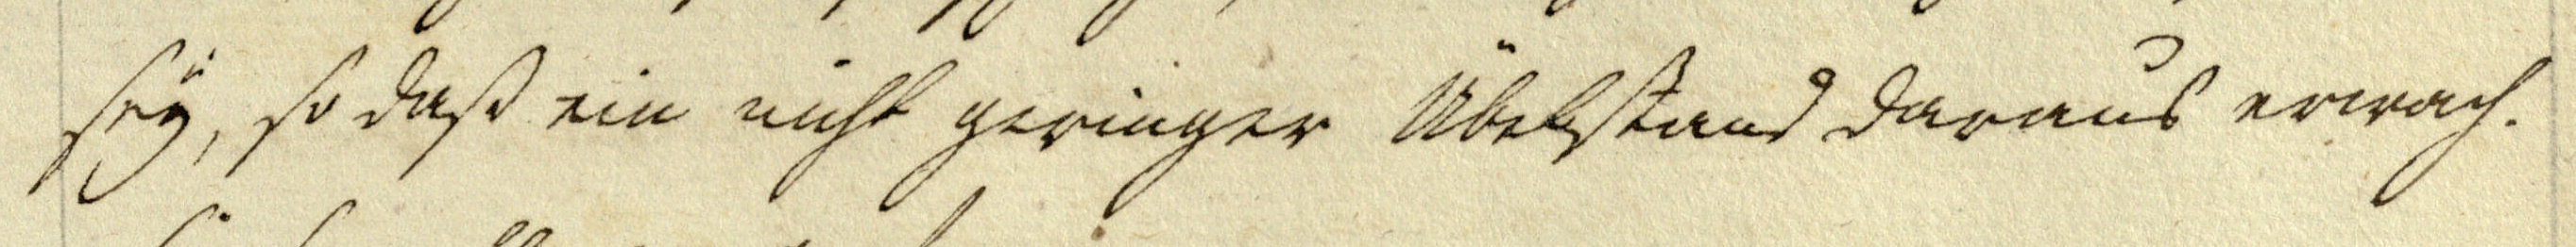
seÿ, so daß ein nicht geringer Übelstand daraus erwach¬
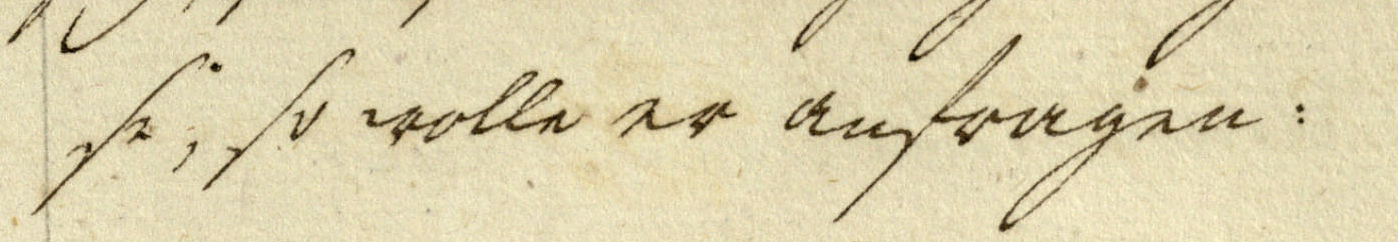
se, so wolle er anfragen:
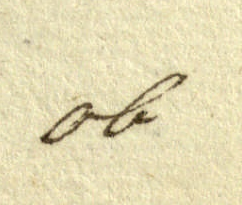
ob
